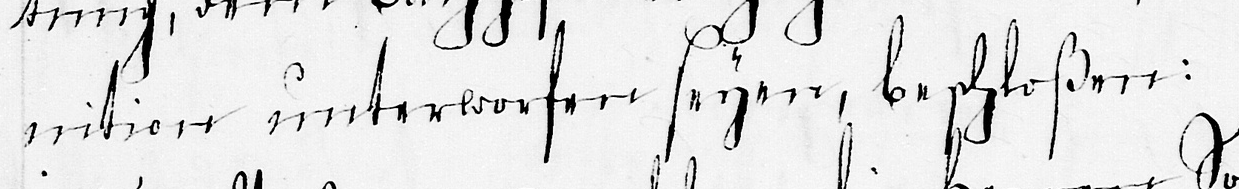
nition unterworfen seyen, beschloßen:
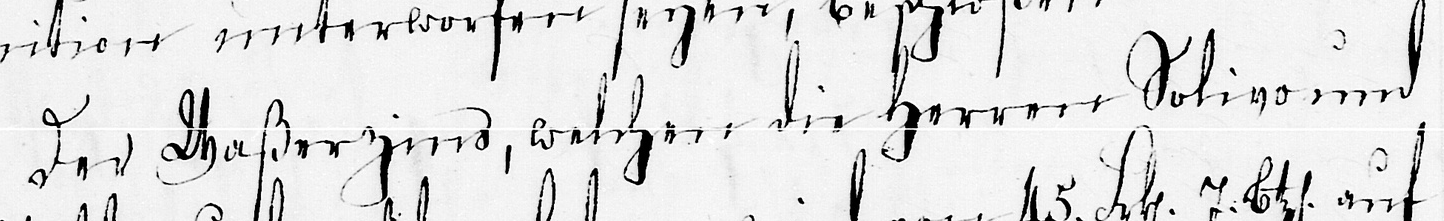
Der Waßerzins, welchen die Herren Solivo und
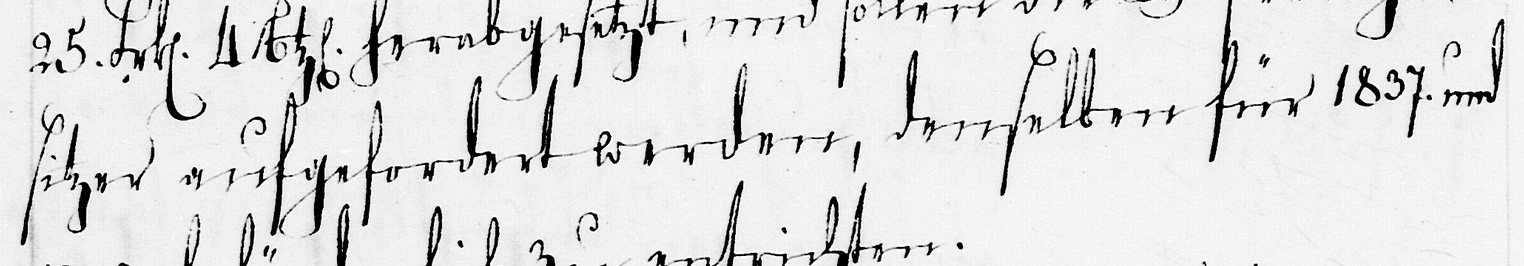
sitzer aufgefordert werden, denselben für 1837. und
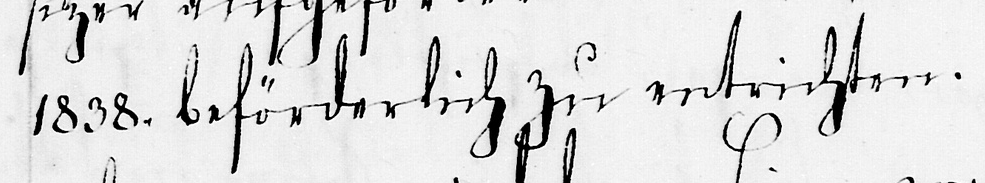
1838. beförderlich zu entrichten.
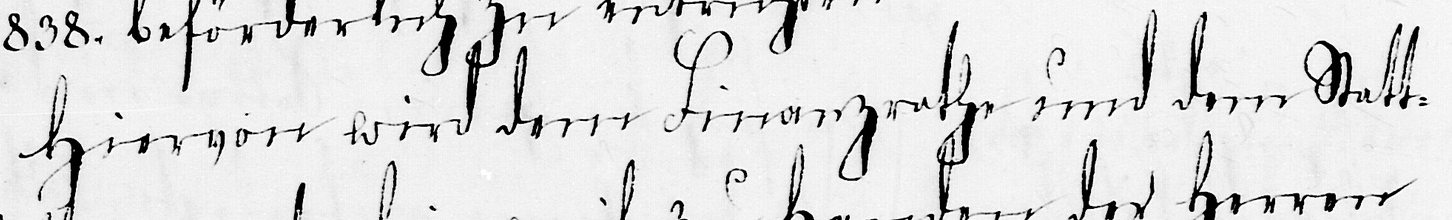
Hiervon wird dem Finanzrathe und dem Statt¬
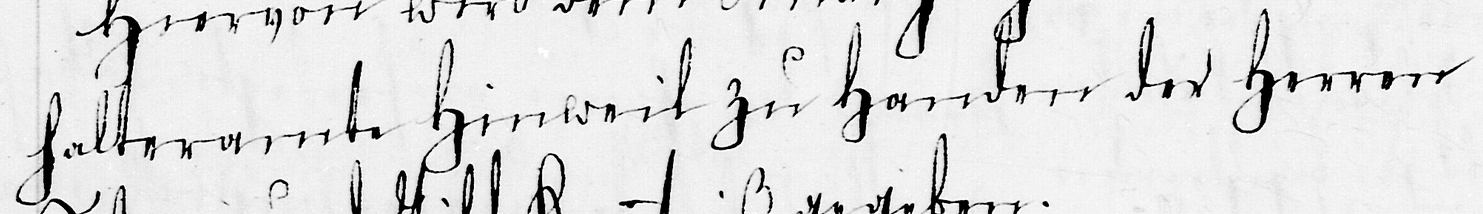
halteramte Hinweil zu Handen der Herren
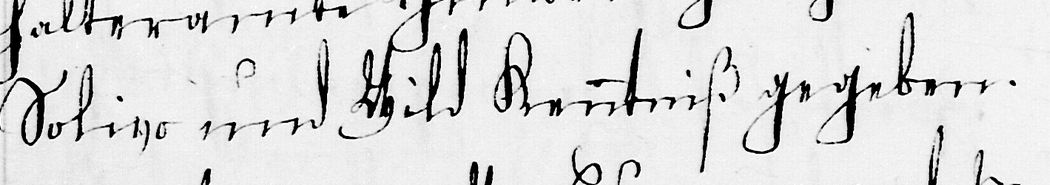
Solivo und Wild Kenntniß gegeben.
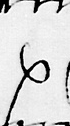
25.
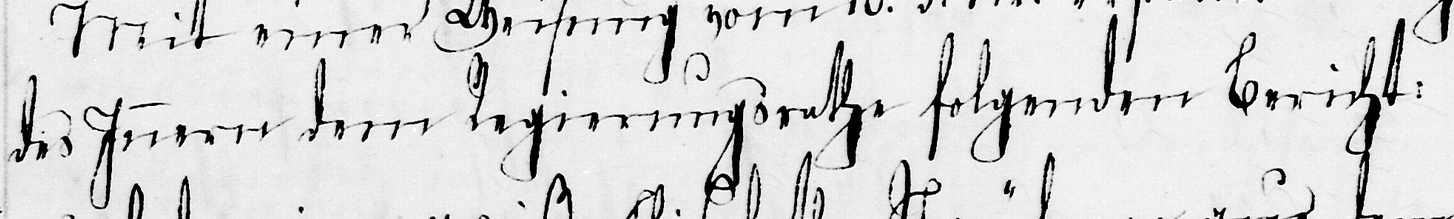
des Innern dem Regierungsrathe folgenden Bericht:
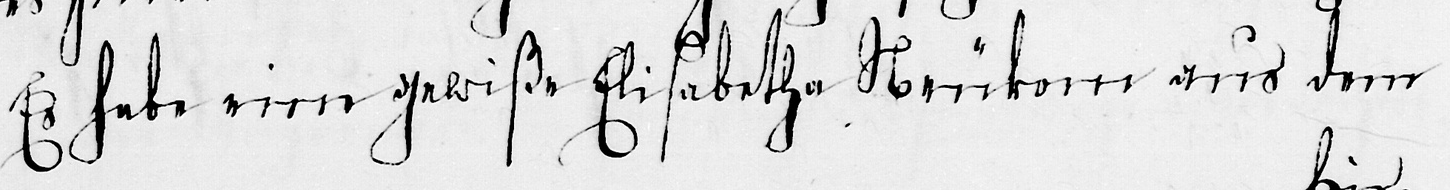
Es habe eine gewiße Elisabetha Neukom aus dem
